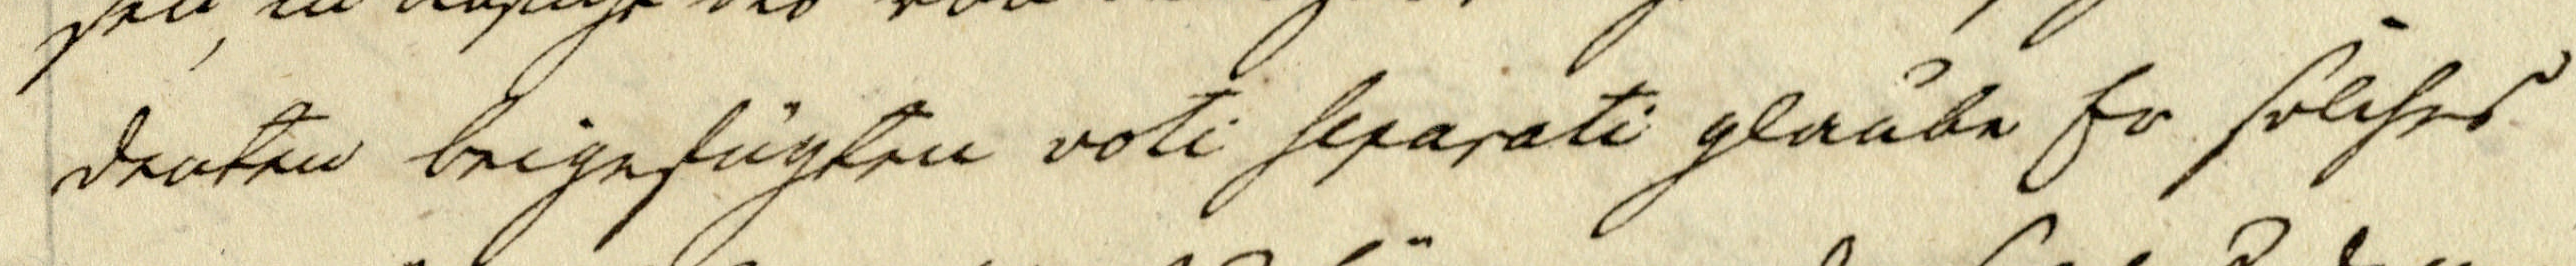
denten beigefügten voti separati glaube Er solches
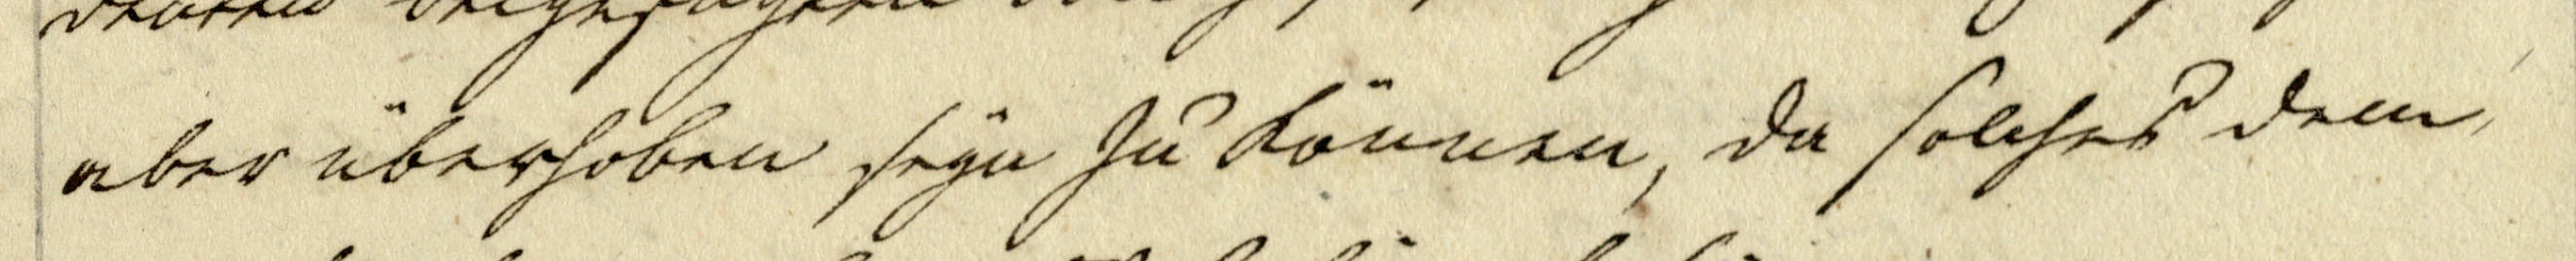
aber überhoben seÿn zu können, da solches dem
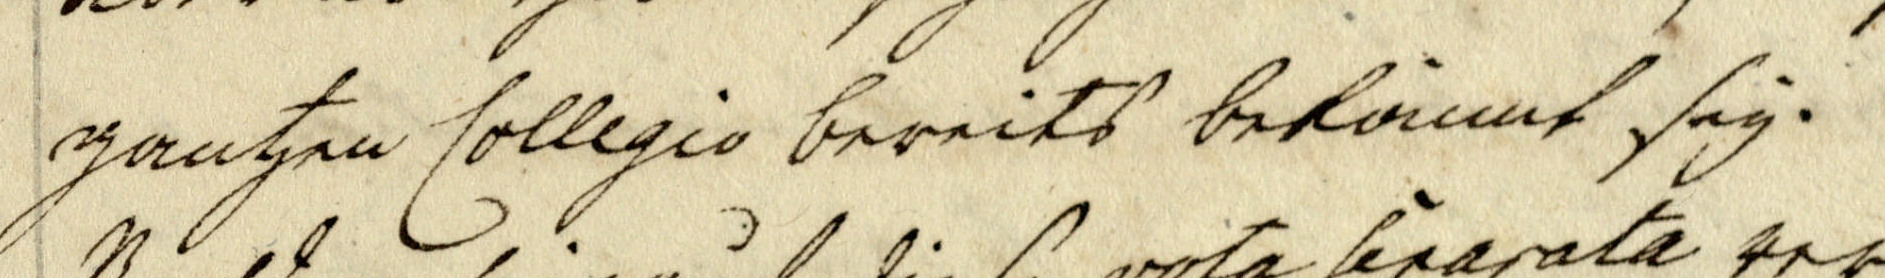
gantzen Collegio bereits bekannt seÿ.
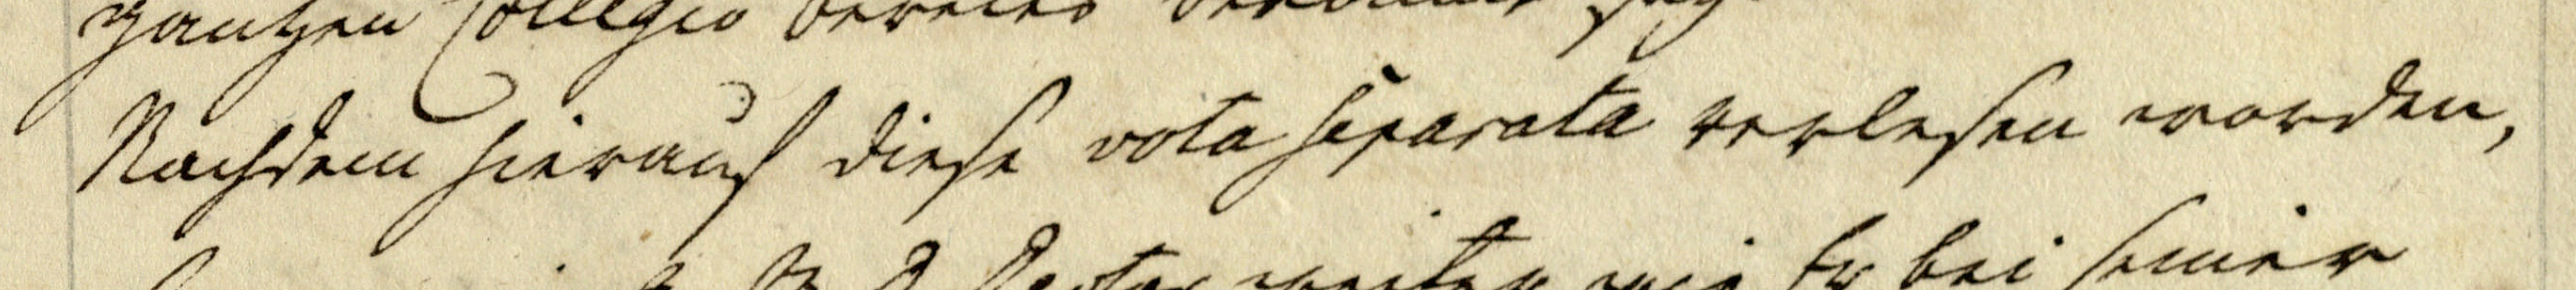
Nachdem hierauf diese vota separata verlesen worden,
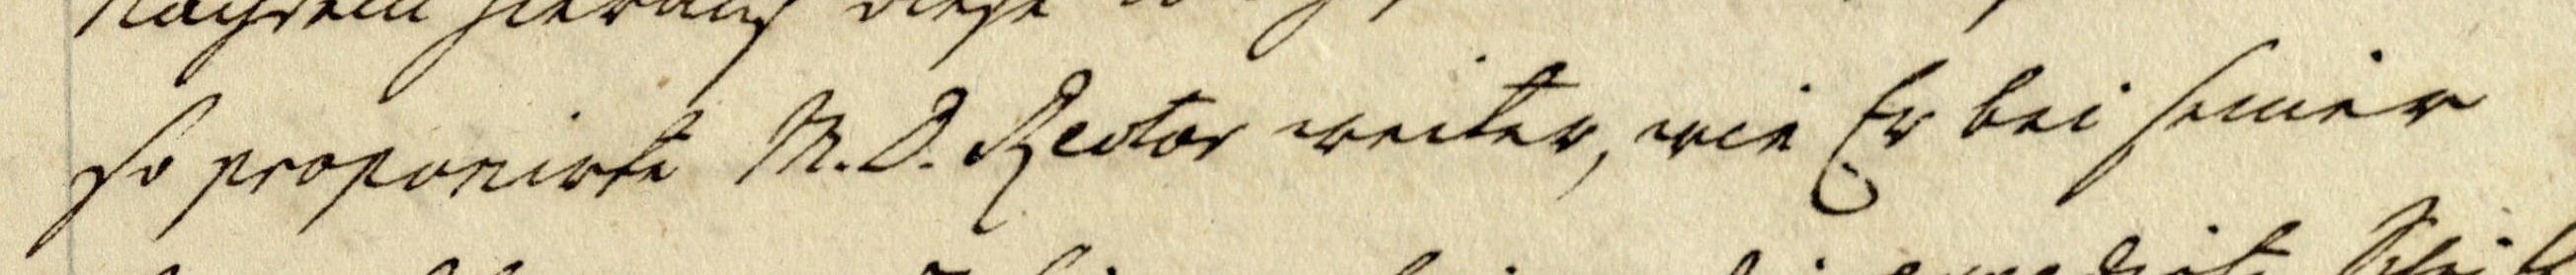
so proponirte M. D. Rector weiter, wie Er bei seiner
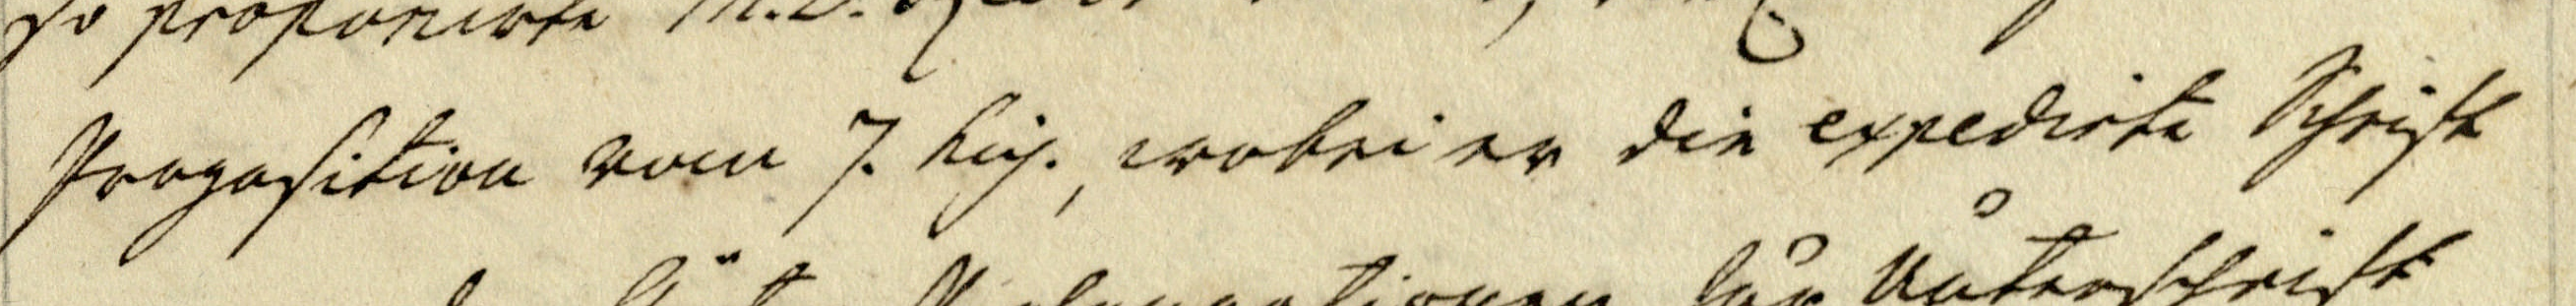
Proposition vom 7. huj., wobei er die expedirte Schrift
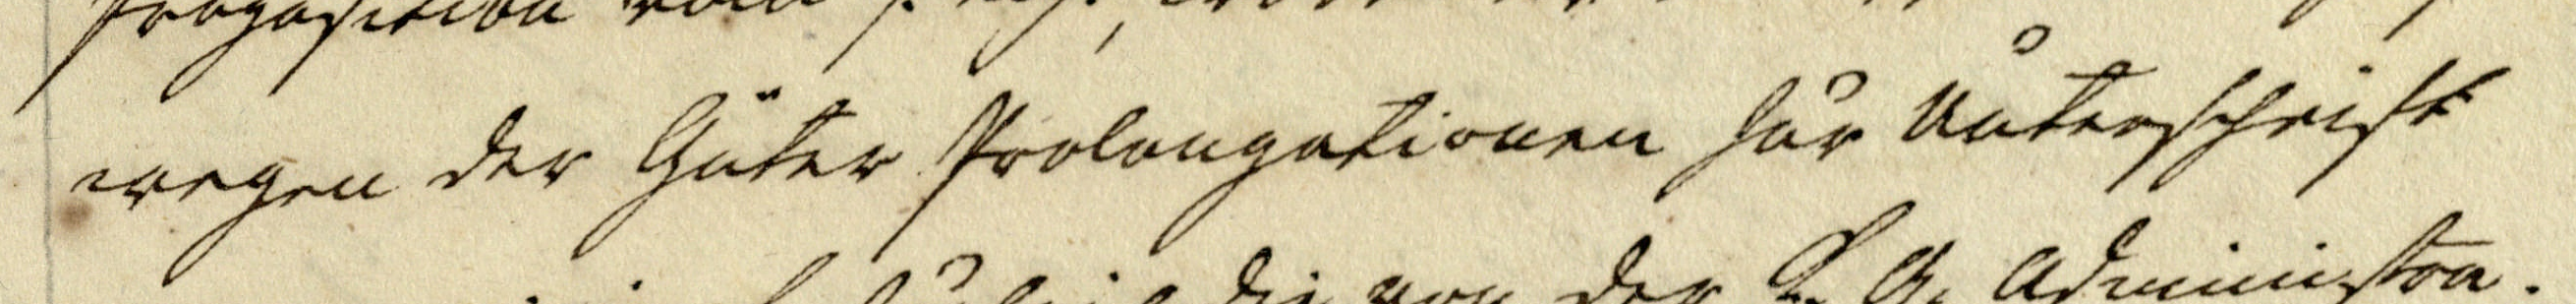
wegen der Güter Prolongationen zur Unterschrift
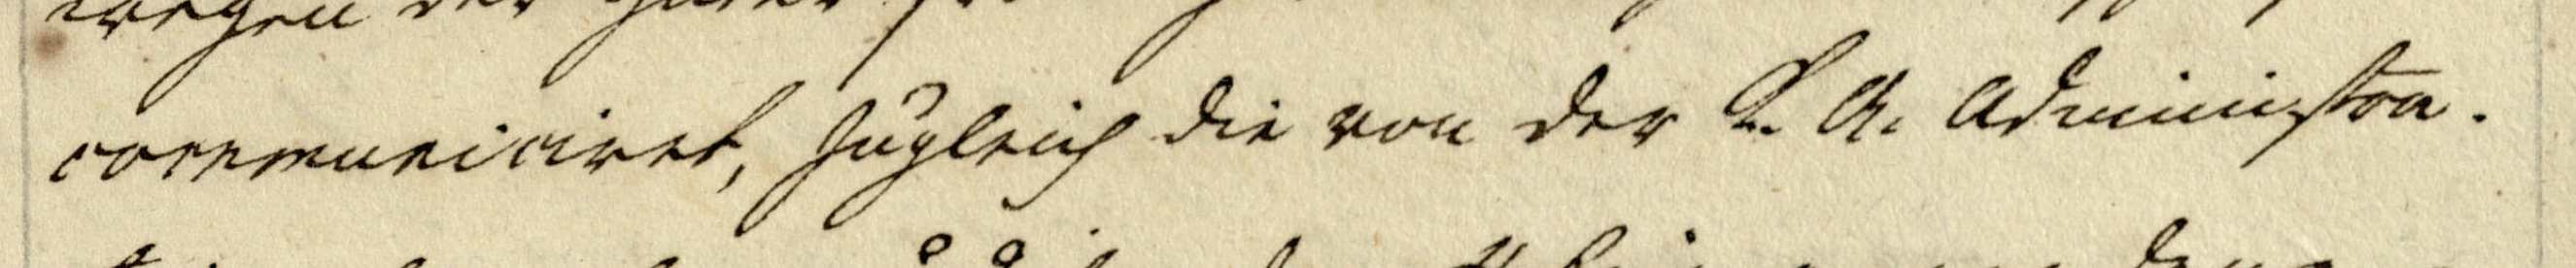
communiciret, zugleich die von der K. d. Administra¬
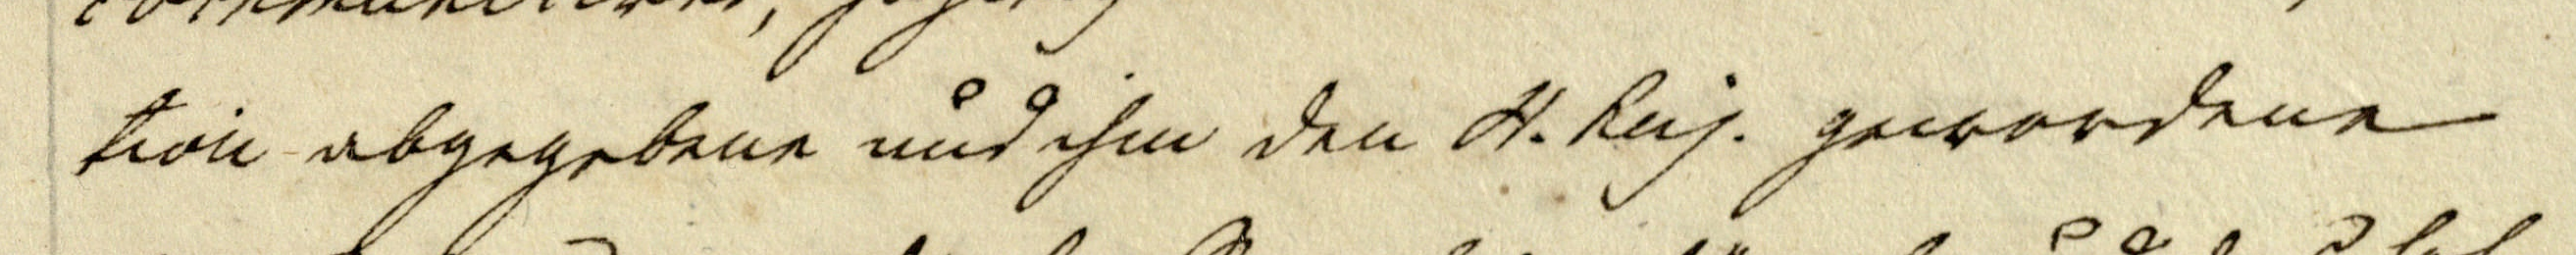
tion abgegebene und ihm den 4. huj. gewordene
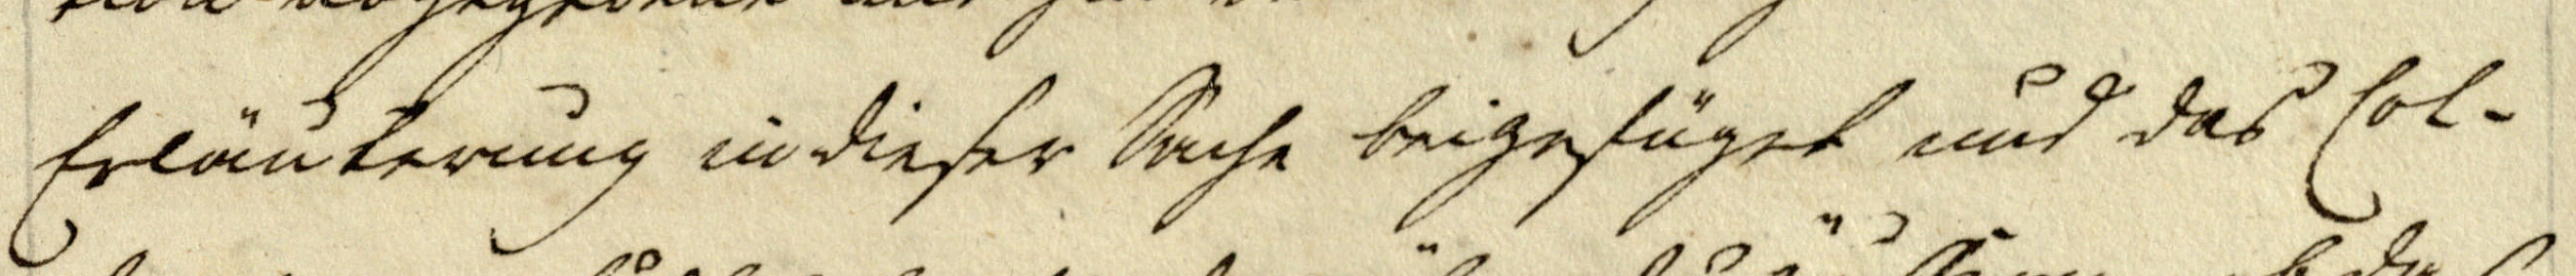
Erläuterung in dieser Sache beigefüget und das Col¬
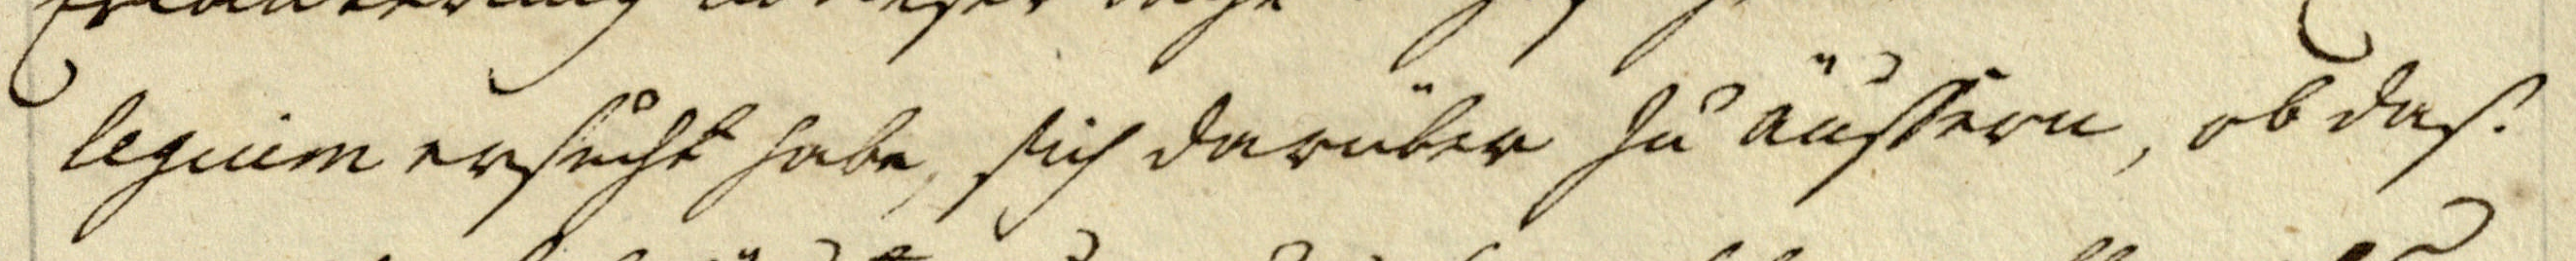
legium ersucht habe, sich darüber zu äussern, ob das¬
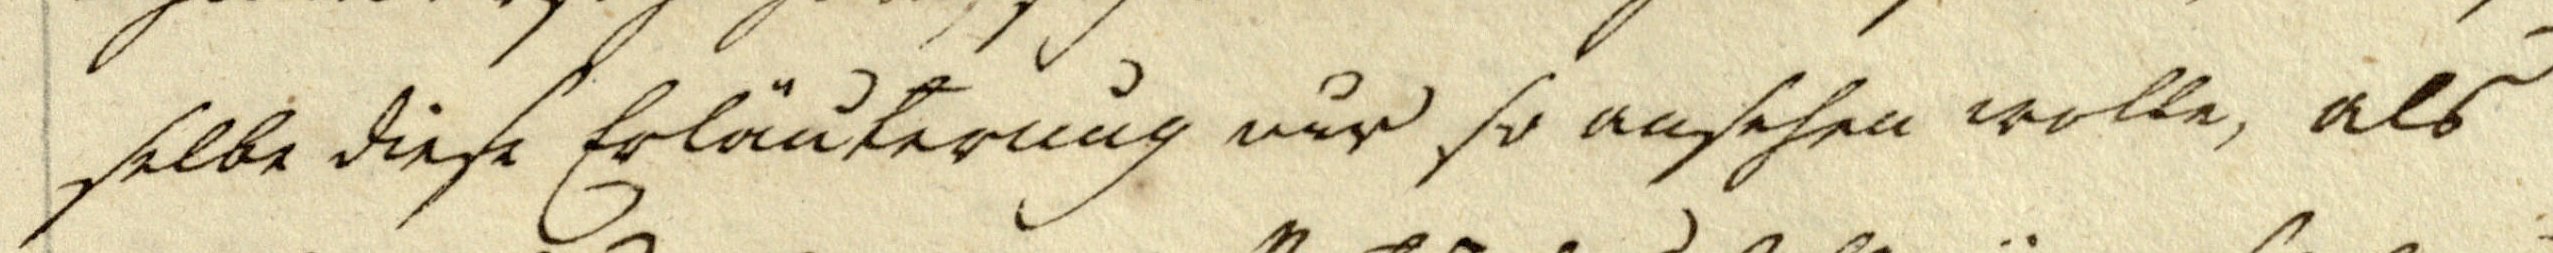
selbe diese Erläuterung nur so ansehen wolle, als
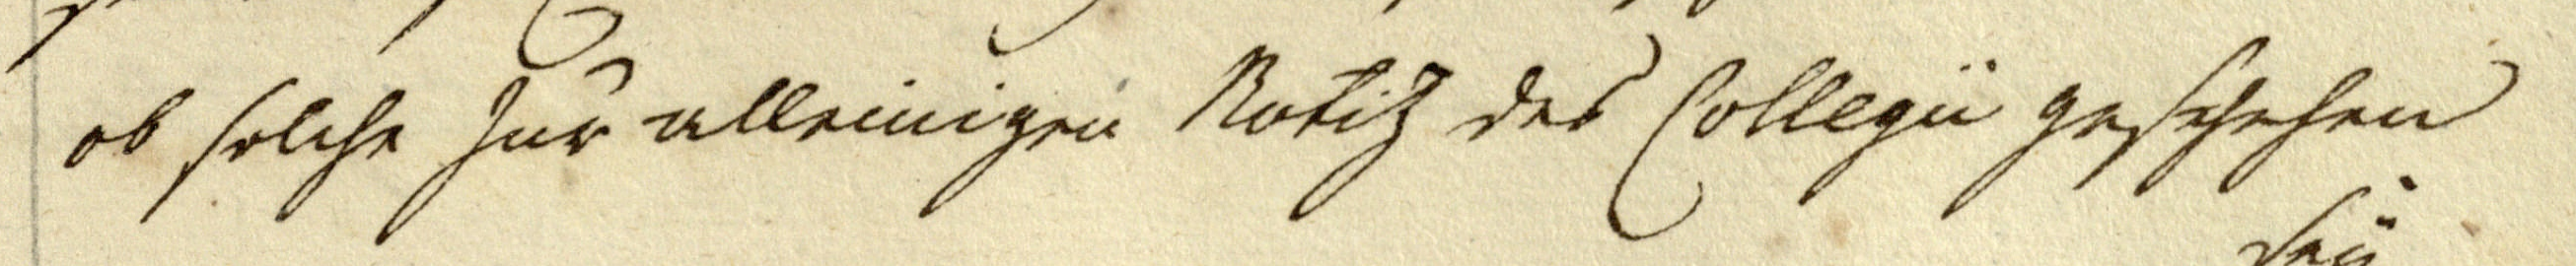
ob solche zur alleinigen Notiz des Collegii geschehen
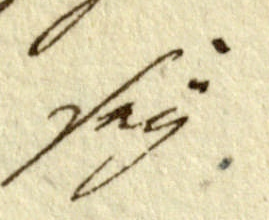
seÿ.
